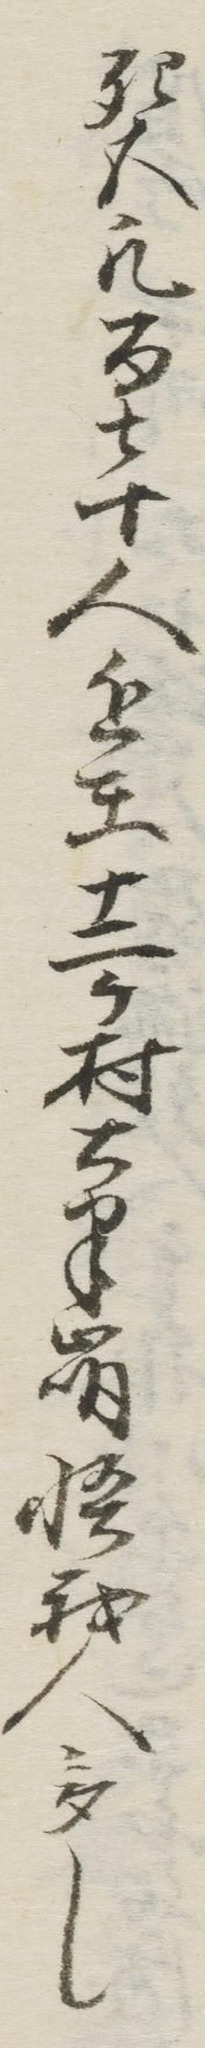死人凡百七十人近在十二ケ村大半崩怪我人多し
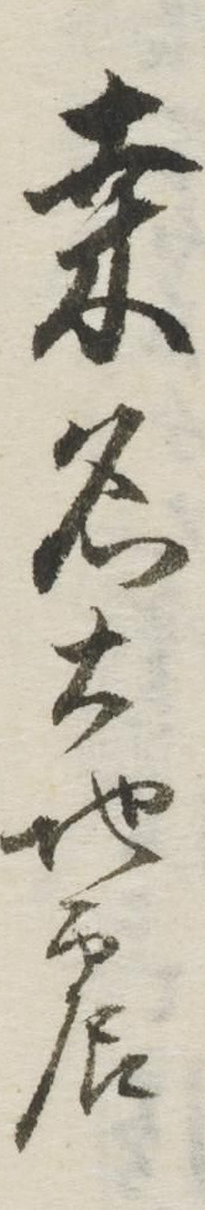桑名大地震
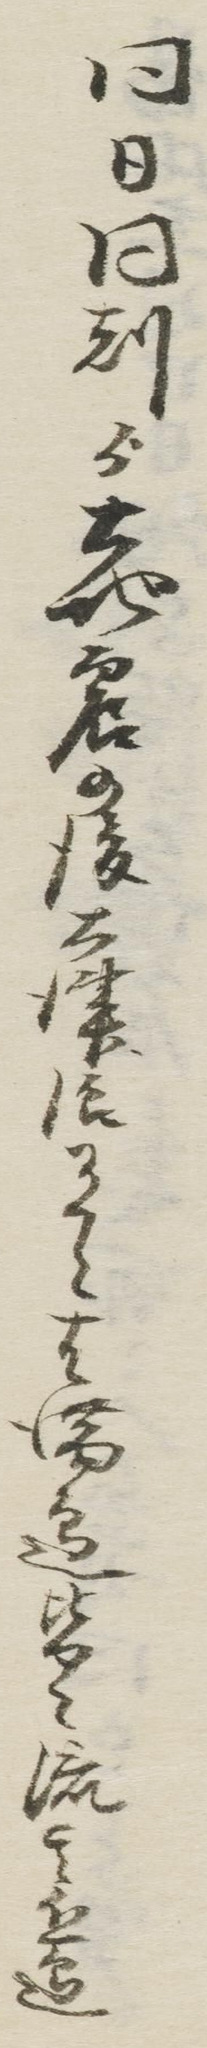同日同刻ゟ大地震の後大津浪有ててはま辺皆々流其近辺
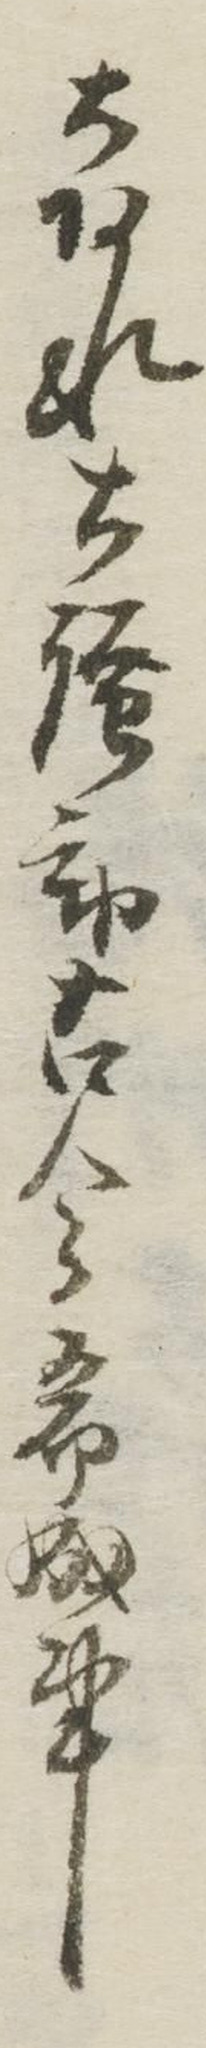大あれ大騒動古今希成事

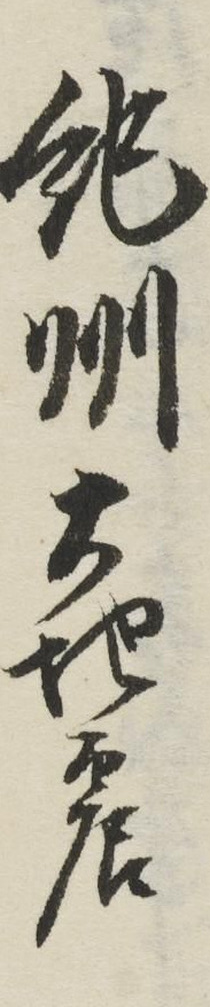紀州大地震
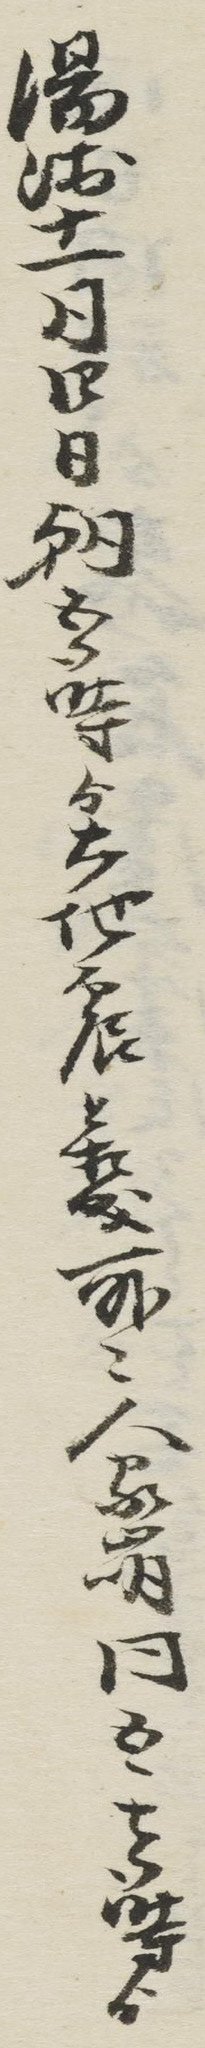湯浅十一月四日朝五ッ時ゟ大地震と相成所々人家崩同五日七ッ時ゟ
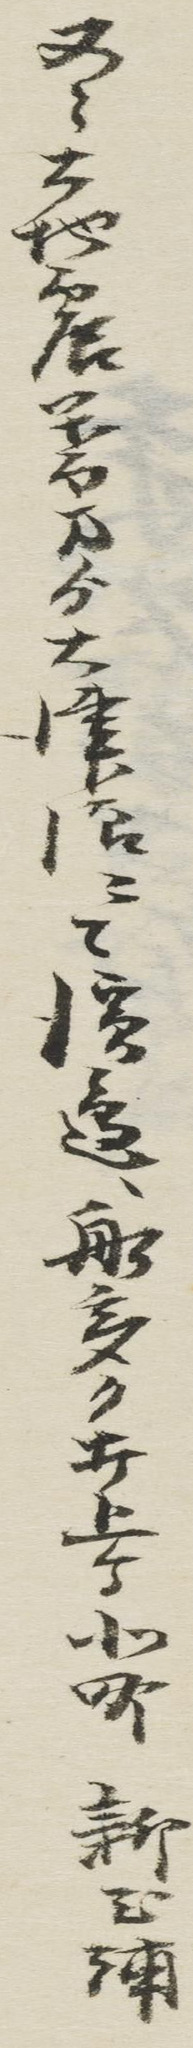又々大地震暮方ゟ大津浪ニて浜辺へ船多ク打上ケ北町新屋鋪
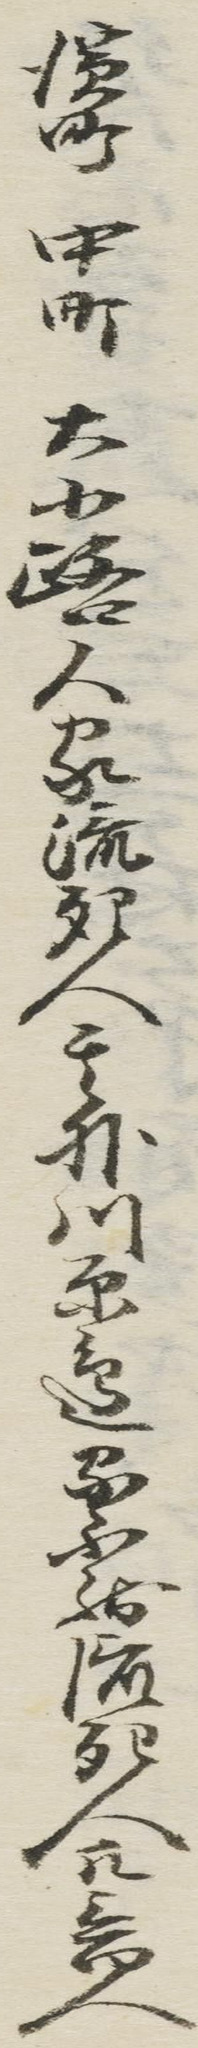浜町中町大小路人家流死人其外川原辺家不残流死人凡三百人
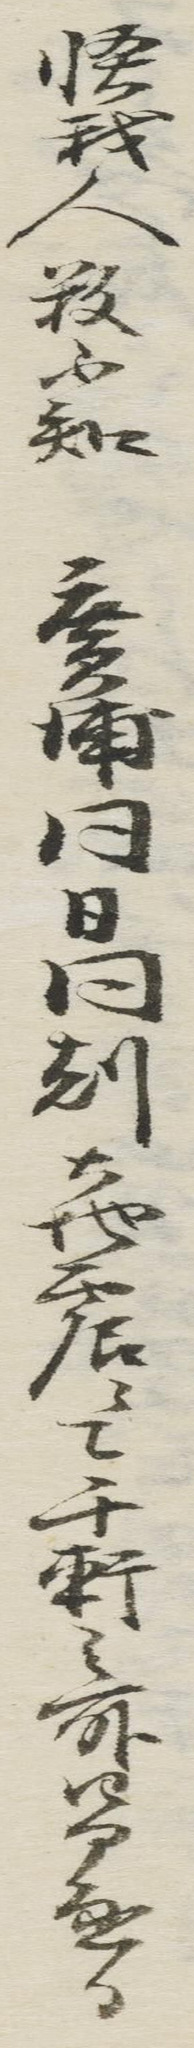怪我人数不知広浦同日同刻大地震ニて千軒之所四部通り
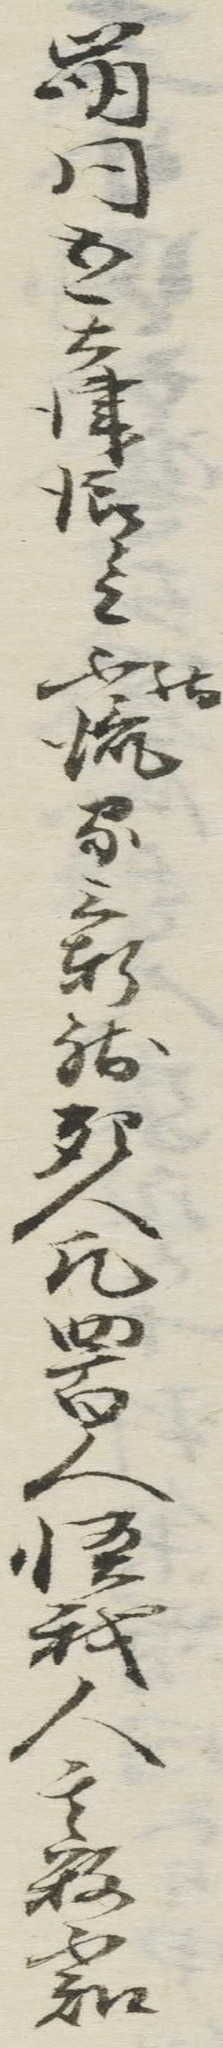崩同五日大津浪ニて不残流家三軒残死人凡四百人怪我人其数不知
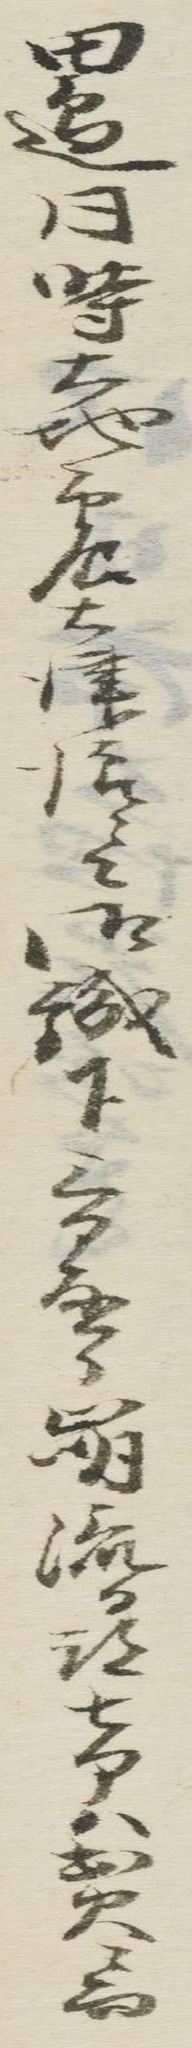田辺同時大地震大津浪三部通り崩流る跡七部ハ出火に而
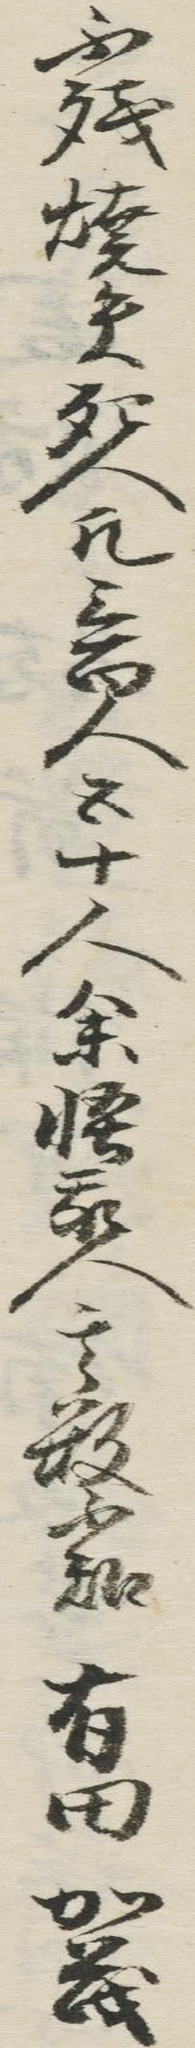不残焼失死人凡三百人五十人余怪我人其数不知有田加茂
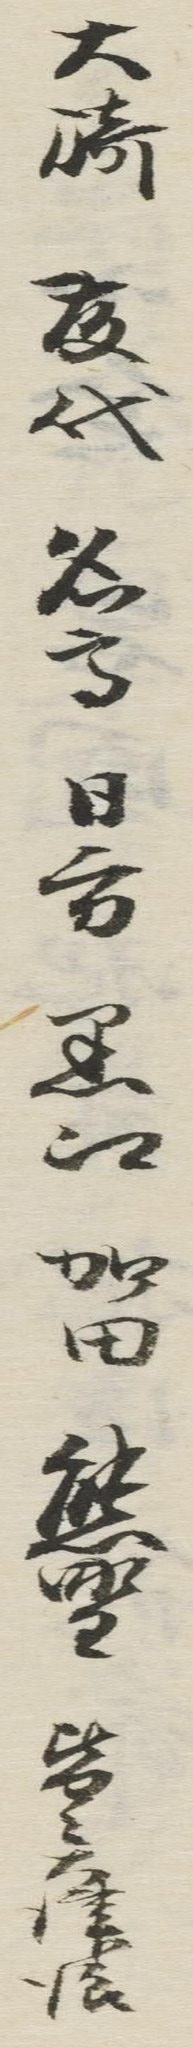大崎藤代名高日方黒江加田熊野皆々大津浪
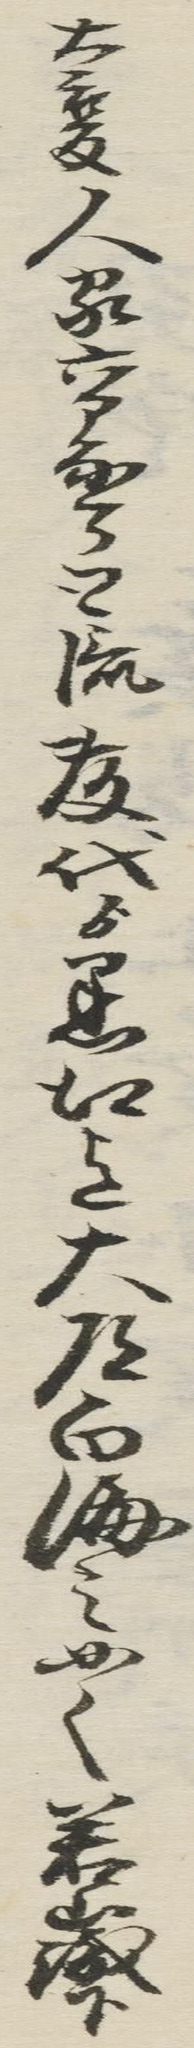大変人家六部通り以上流藤代ゟ黒江迄大道白海の如く若山城下
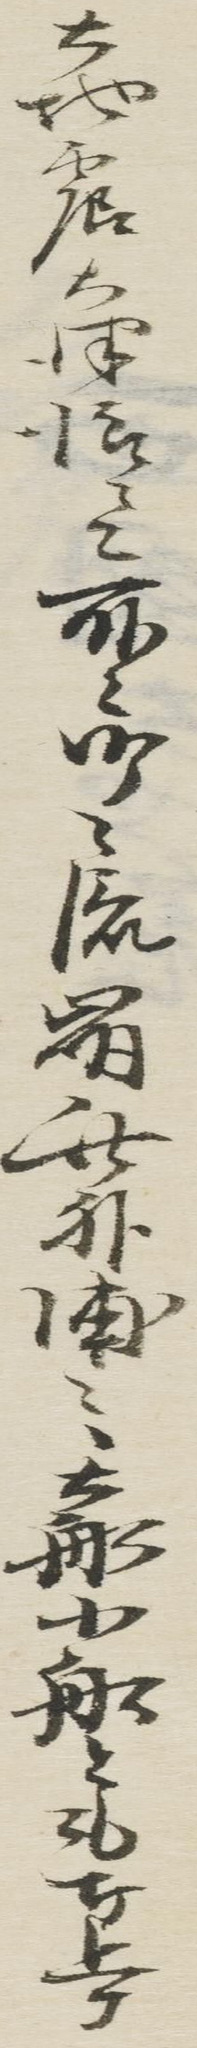大地震大津浪ニて所々町々流崩此外浦々大船小船とも打上ケ
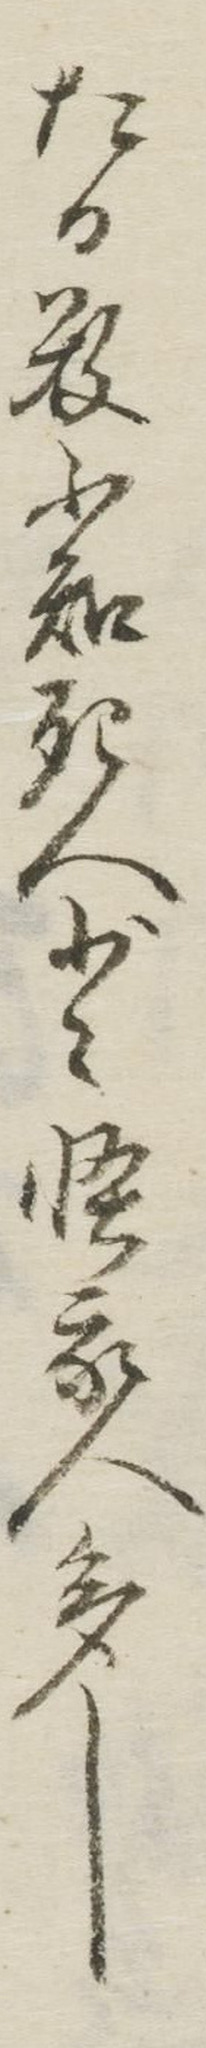たる数不知死人少々怪我人多し
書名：諸国大地震大津波一代記
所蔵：東京大学地震研究所図書室 Earthquake Research Institute Library, The University of Tokyo, JAPAN
